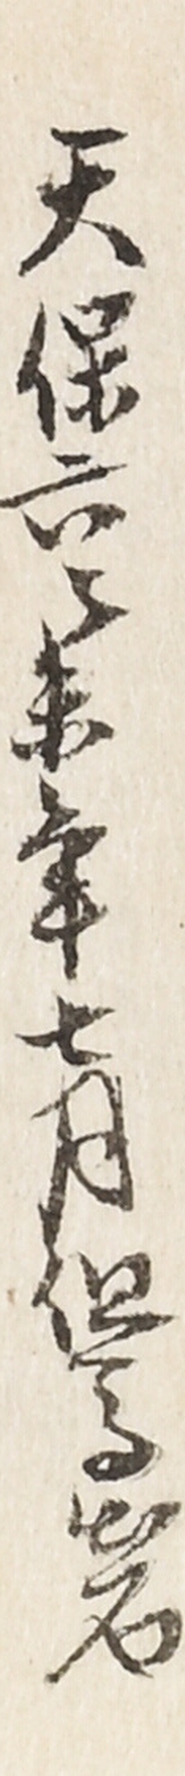天保六乙未年七月但馬出石
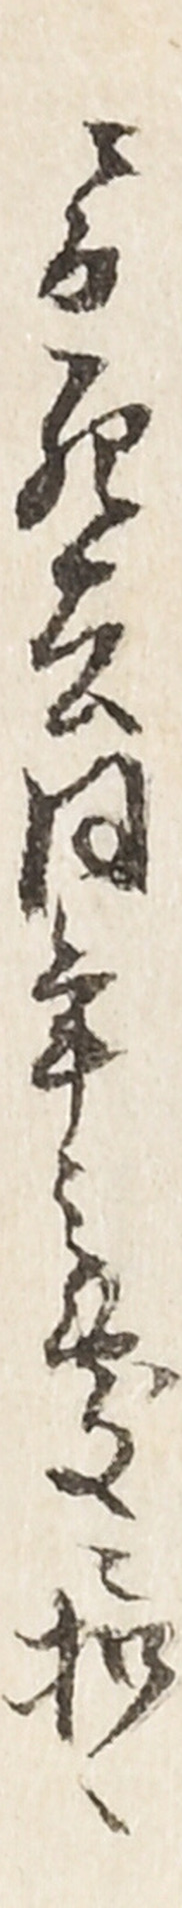ニ而死去同年之処ニ扣へ
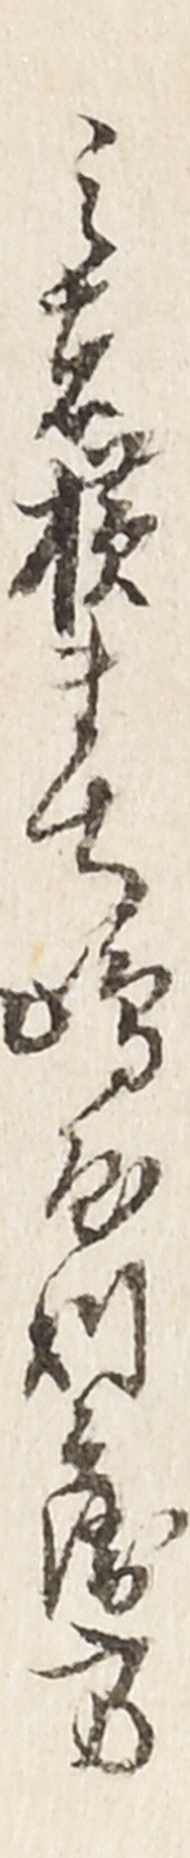之者横まち嶋屋利兵衛方
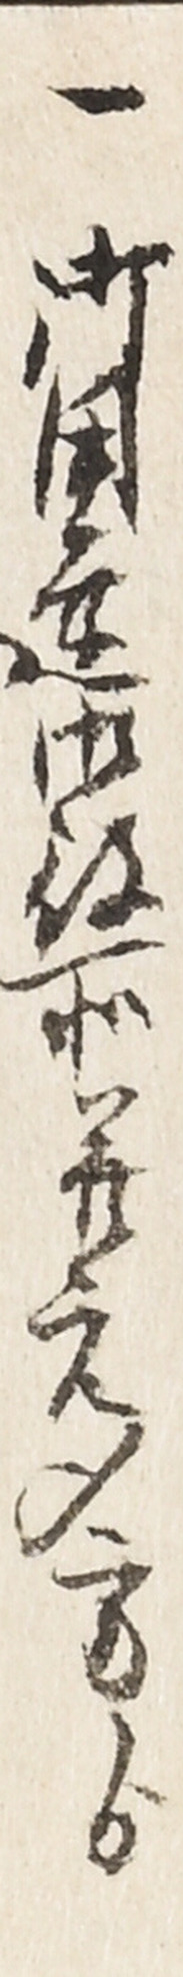一御用達御役所并元〆方より
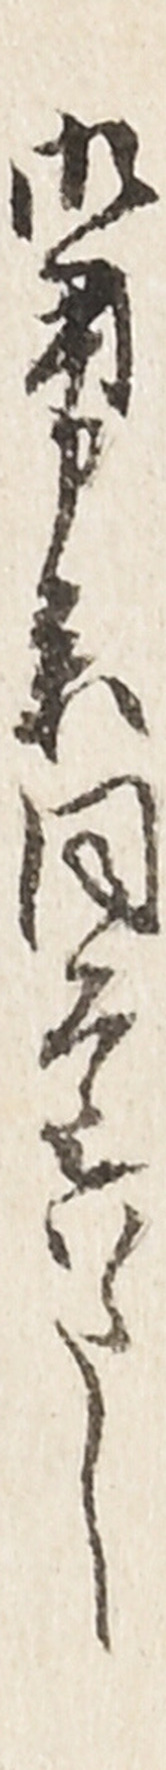御用申参同道いたし
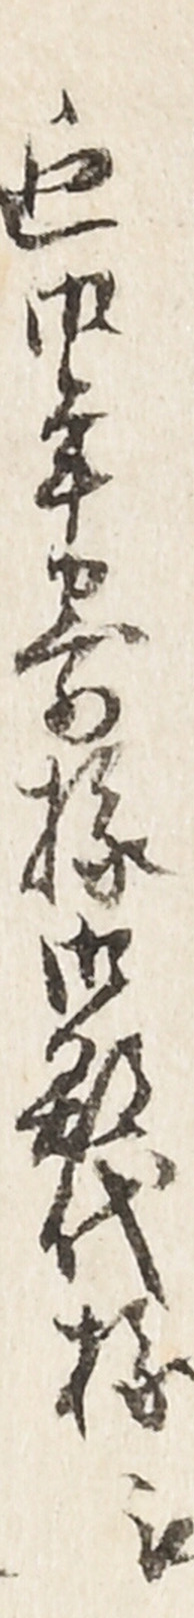廻御年寄様御郡代様江
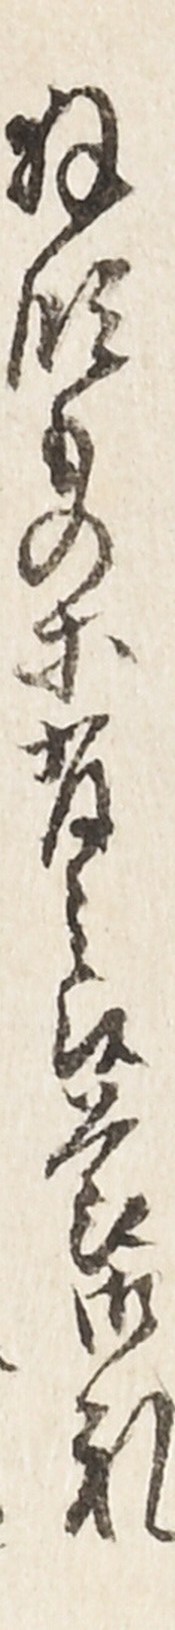拝領もの等有之候節御礼
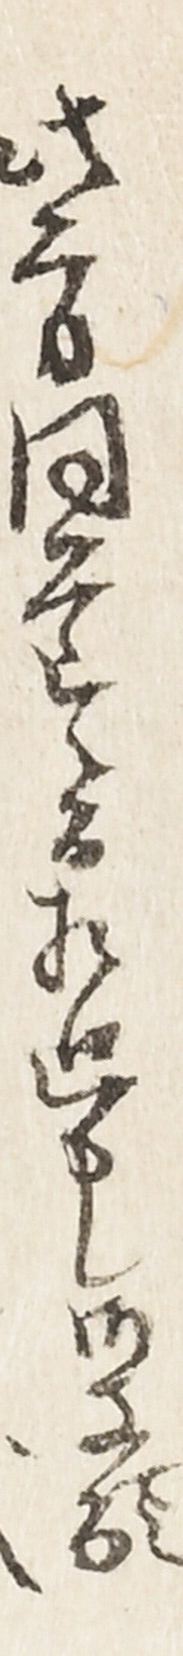此方同道ニ而相廻申候御支配
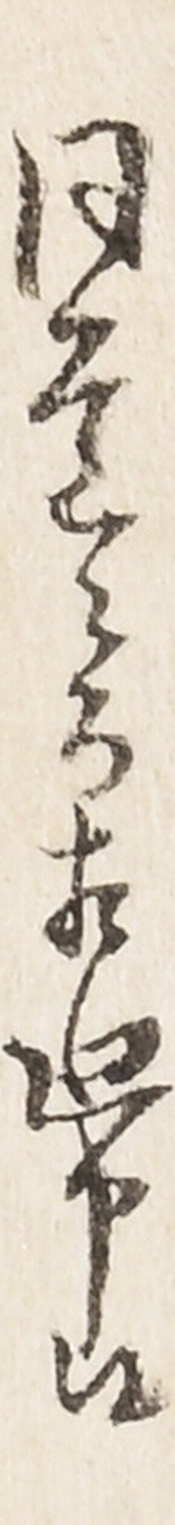同道ニ而相廻申候
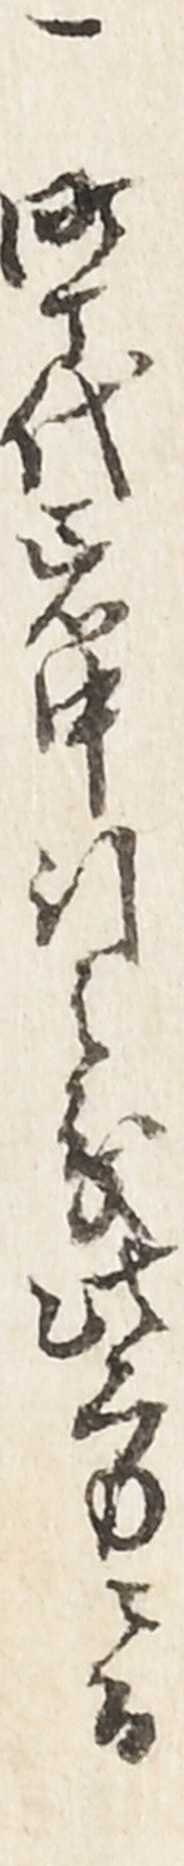一町丁代着中引之義ニ此上方二而
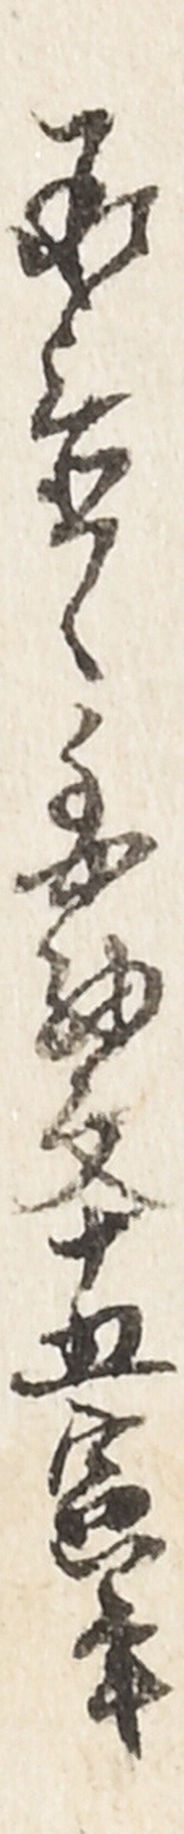承置候委細文十五寅年
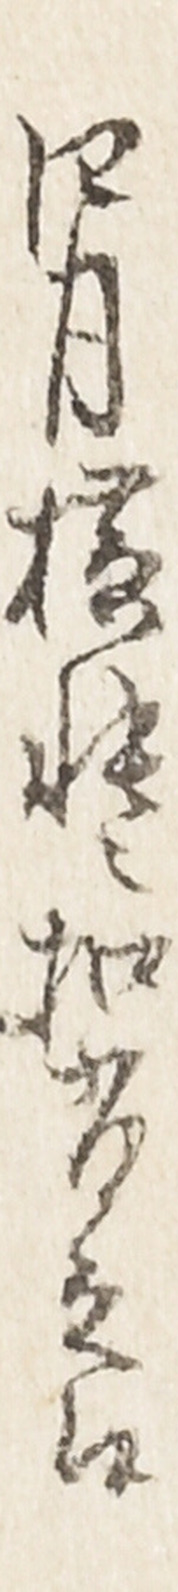四月横帳ニ扣有之候
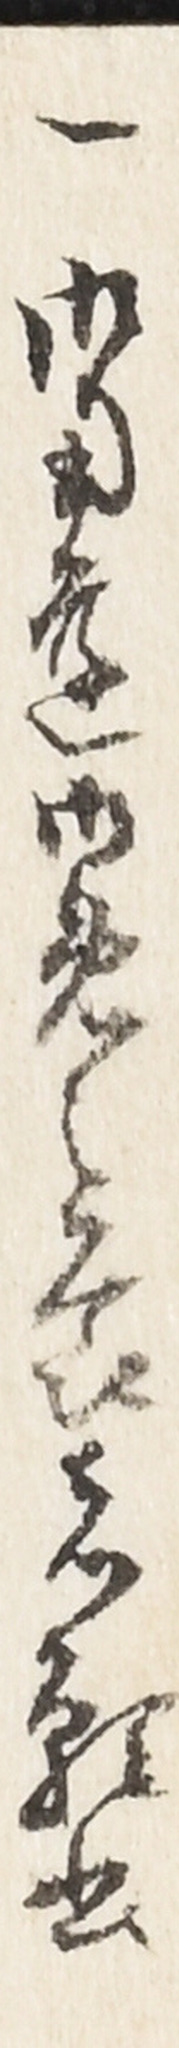一御用意御免之節者願書
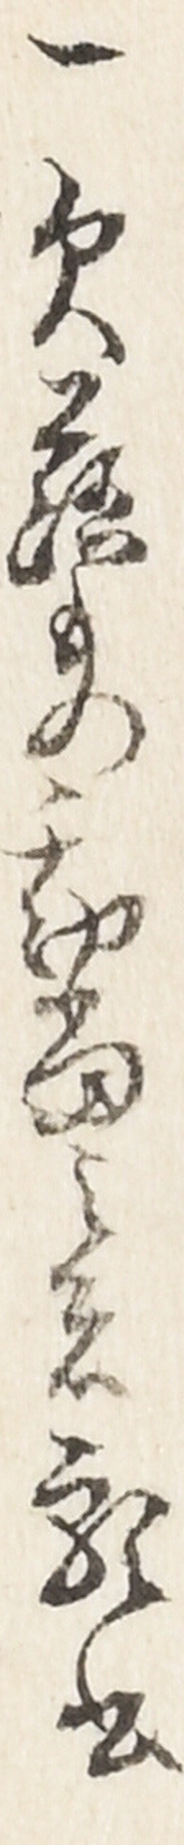一欠落もの勘当之者願書
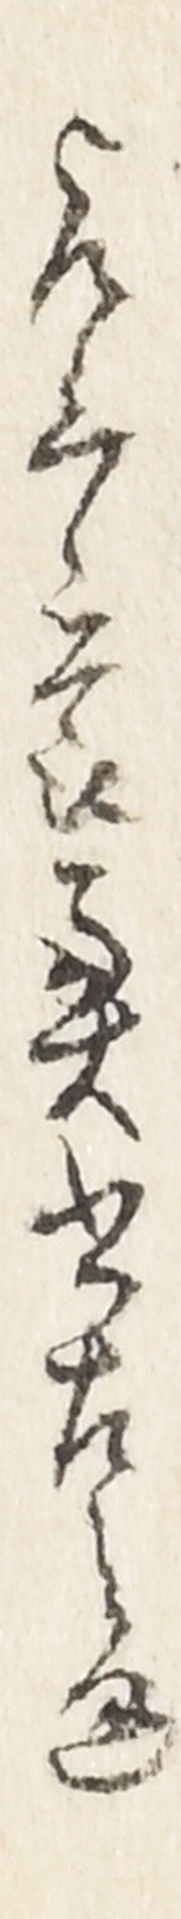差上候節奥書左之通
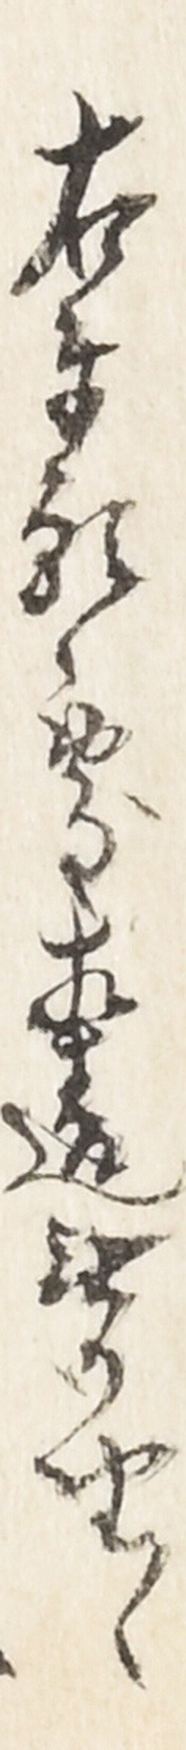右奉願候処相違無御座候
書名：年内行事懐中録
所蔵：伊那市立高遠町図書館・合同会社AMANE
